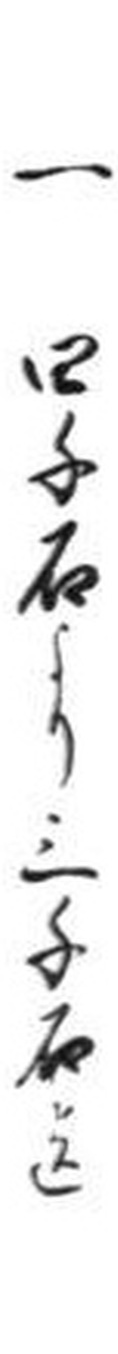一四千石より三千石迄
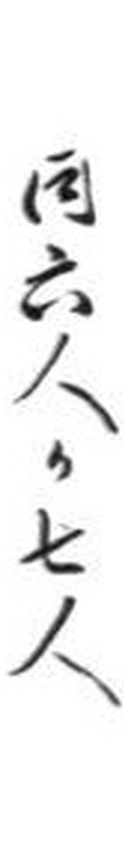同六人か七人
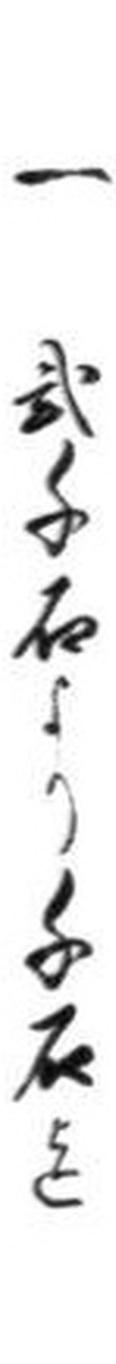一弐千石より千石迄
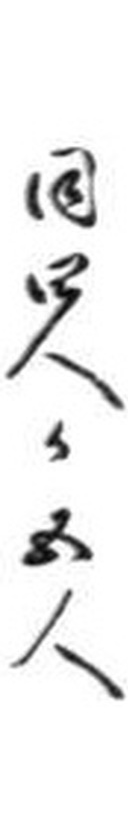同四人か五人
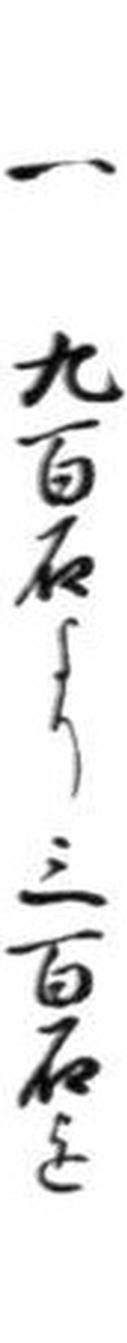一九百石より三百石迄
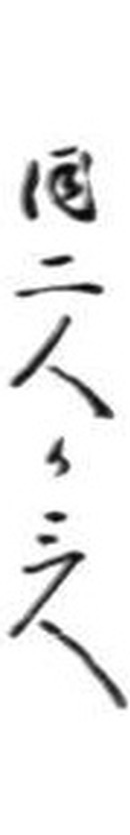同二人か三人
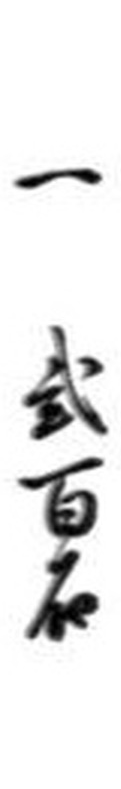一弐百石
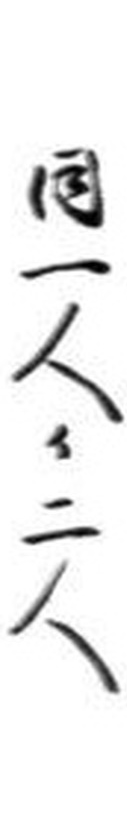同一人か二人
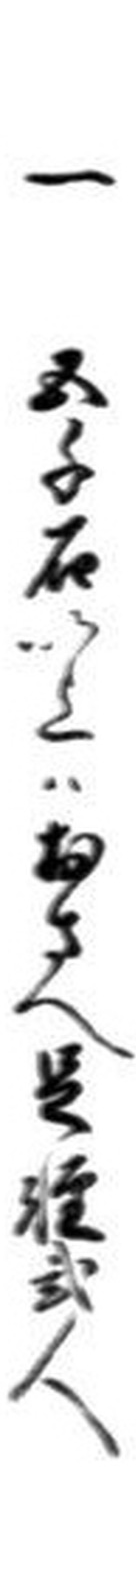一五千石以上ハおさへ足軽弐人
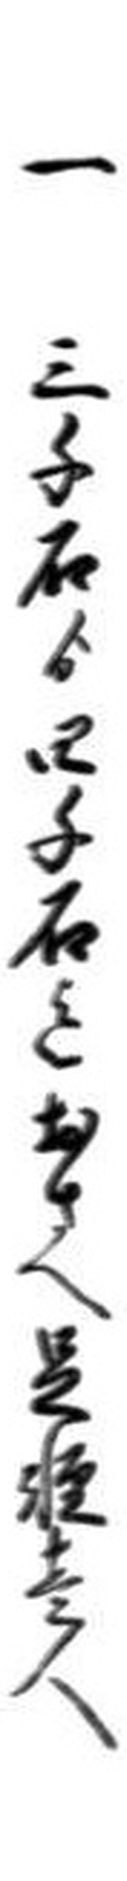一三千石ゟ四千石迄おさへ足軽壱人
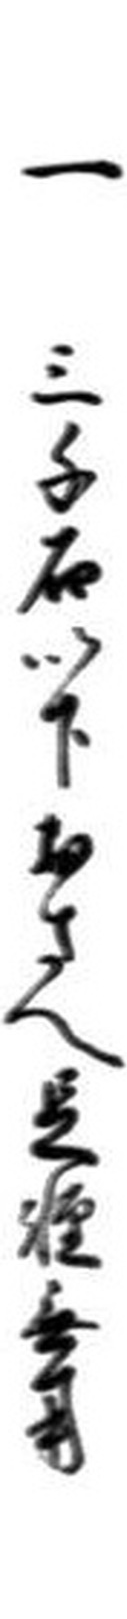一三千石以下おさへ足軽無用
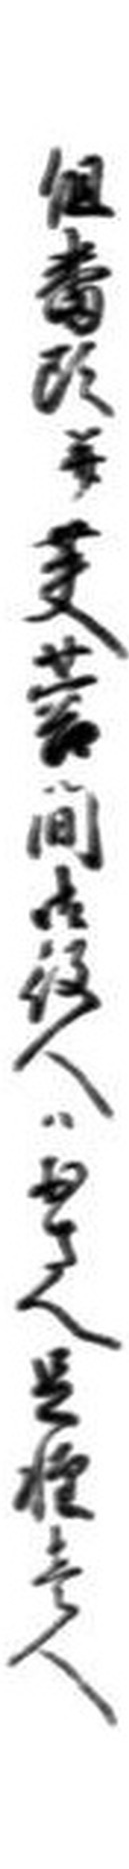但番頭并芙蓉間御役人ハおさへ足軽壱人
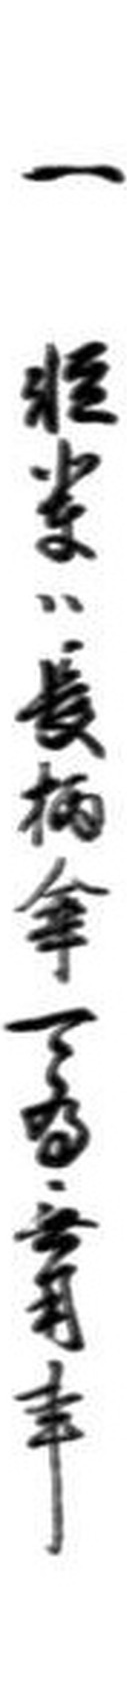一軽輩ハ長柄傘可為無用事
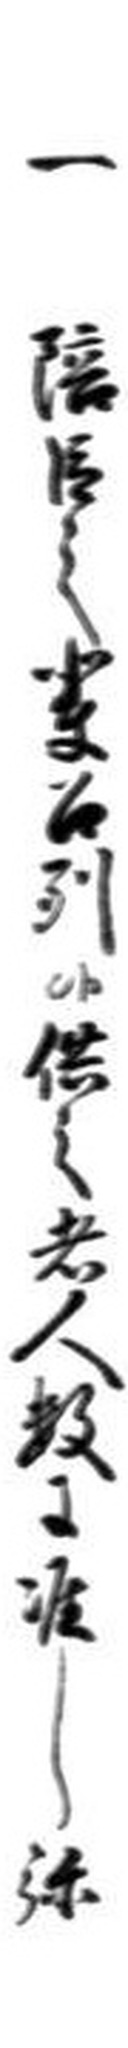一陪臣之輩召列候供之者人数に准し弥
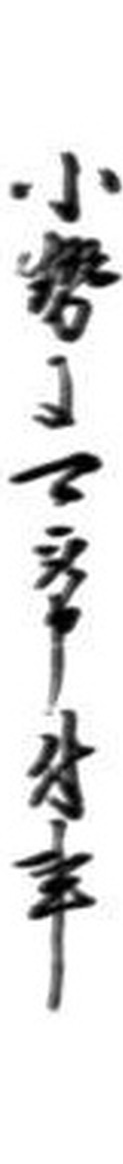小勢に可被申付事
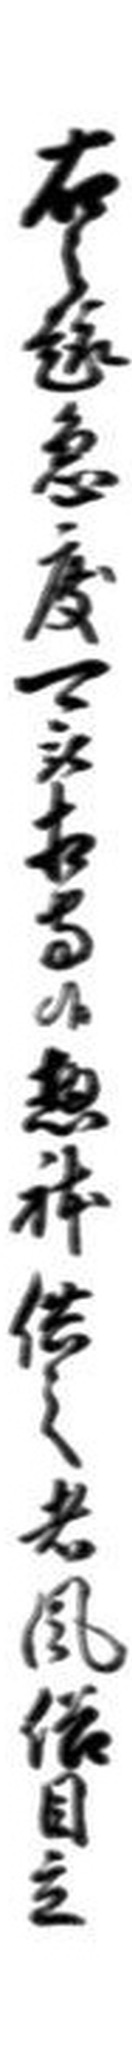右之趣急度可被相守候惣体供之者風俗目立
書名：家譜 三十二 吉邦公 従享保二年到享保三年
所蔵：福井県文書館 Fukui Prefectural Archives
